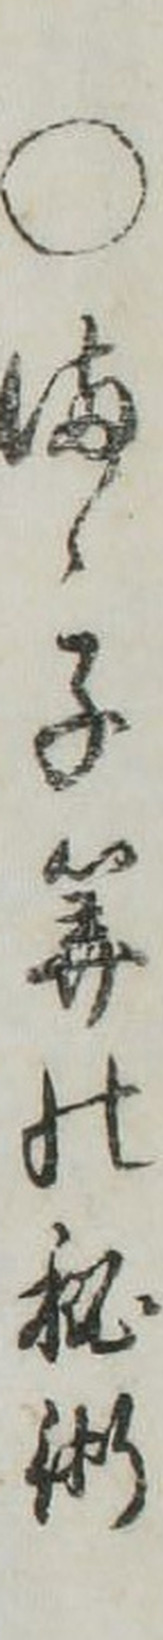○まゝ子算の秘術
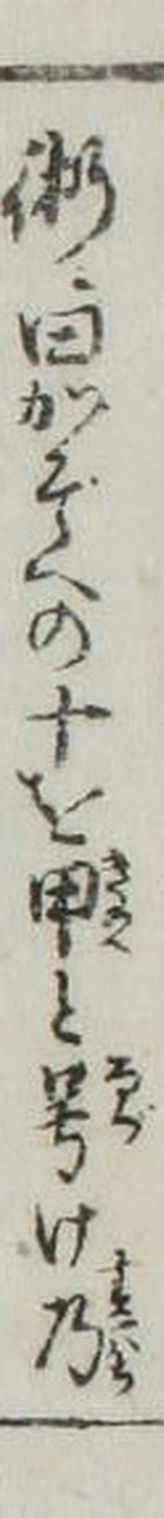術に曰かぞへの十を甲と号け乃
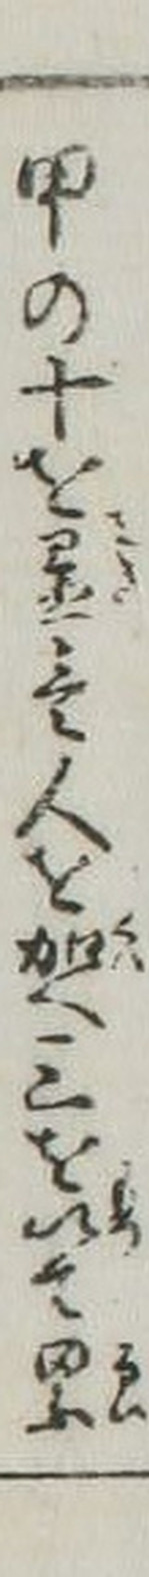甲の十を置壱人を加へ三を以て累
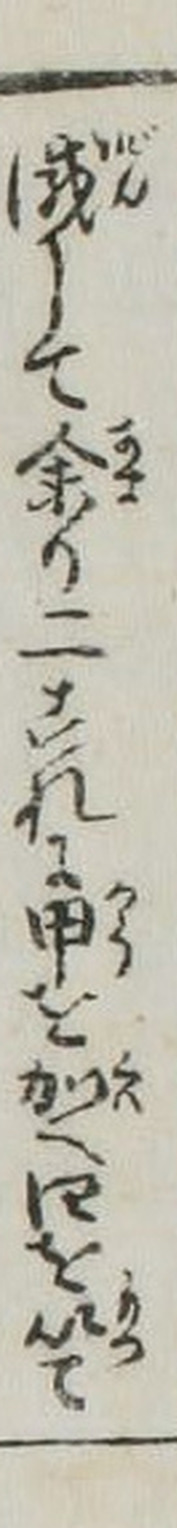減して余り二これに甲を加へ四を以て
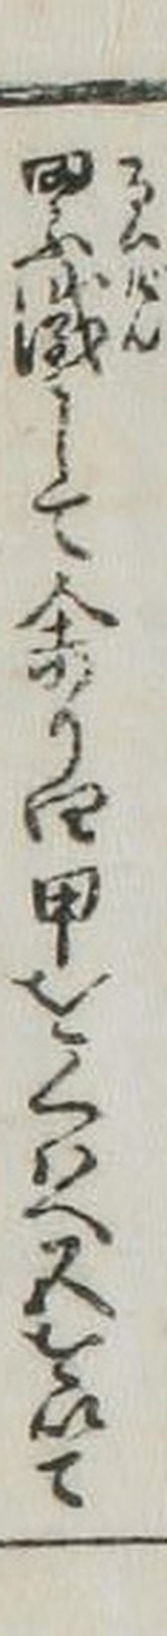累減して余り四甲をくはへ五を以て
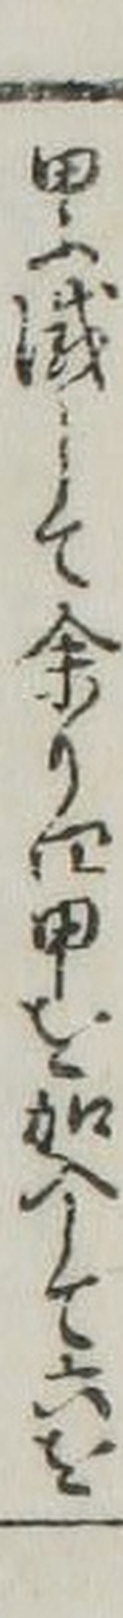累減して余り四甲を加入して六を
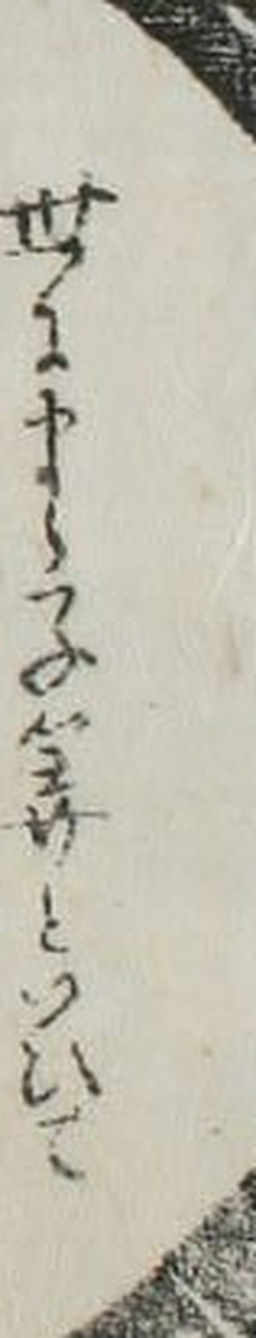世にまゝ子算といひて
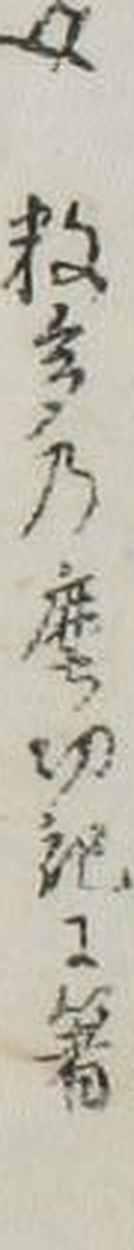数多の塵功記に著
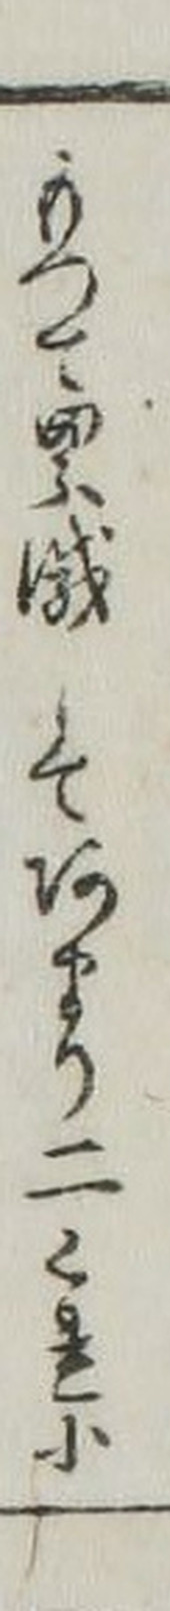もつて累減してあまり二これに
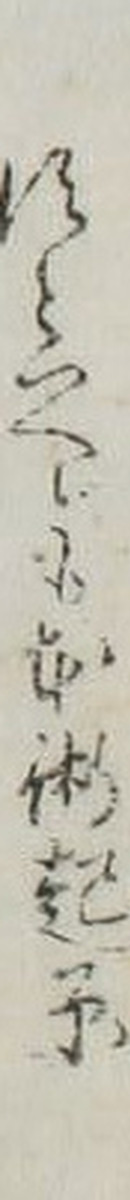すといへとも本術起原
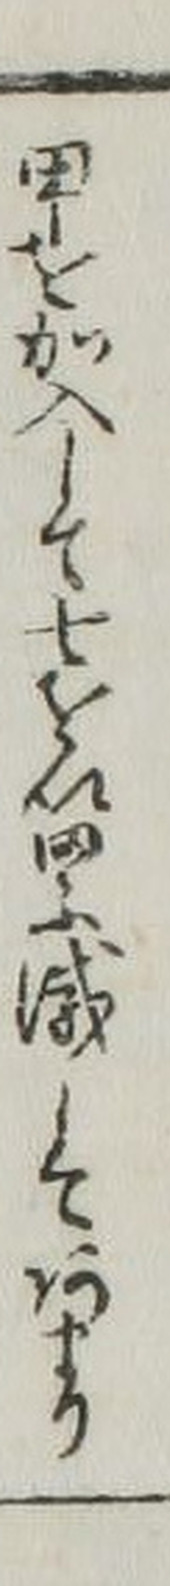甲を加入して七を以累減してあまり
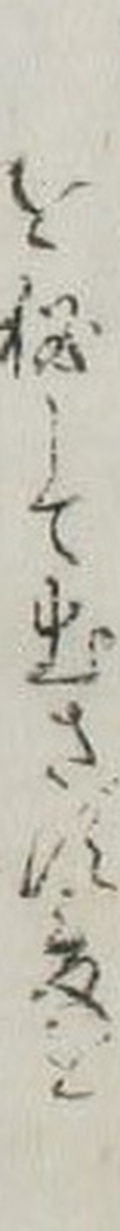を秘して出さず爰を
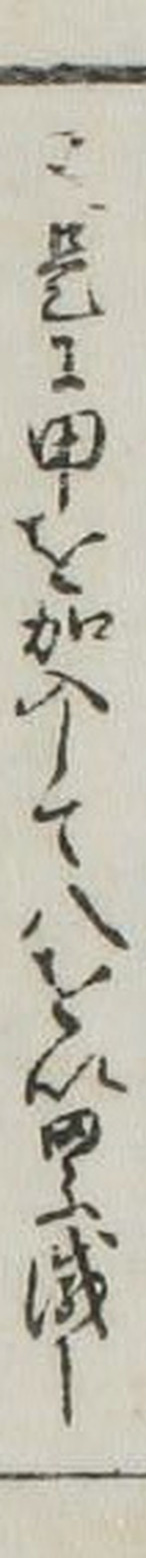五是に甲を加入して八を以累減し
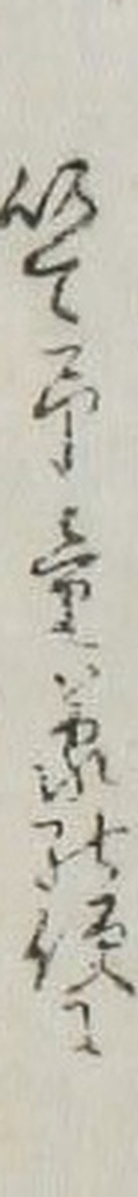以て予童蒙の便に
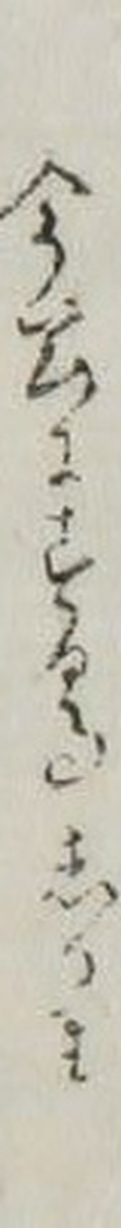今公にする事しるす
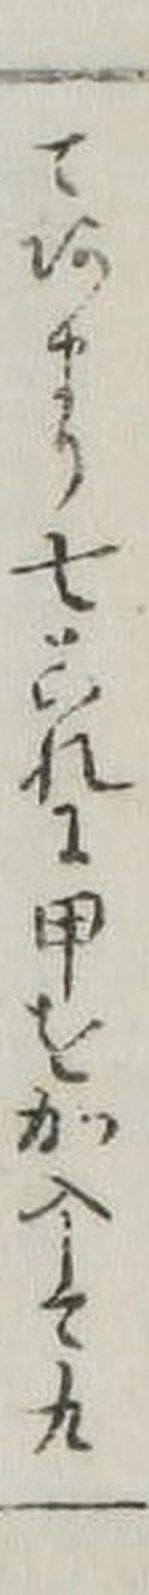てあまり七これに甲を加入して九
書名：宝玉塵劫記
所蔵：東京学芸大学教育コンテンツアーカイブ
